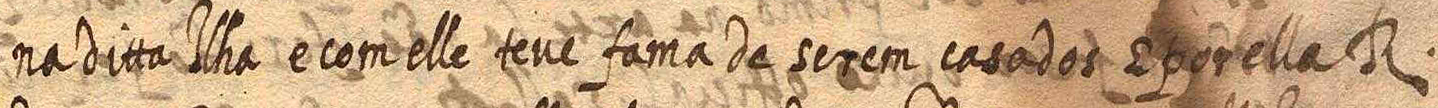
na ditta Ilha e com elle teue fama de serem casados E por ella R.
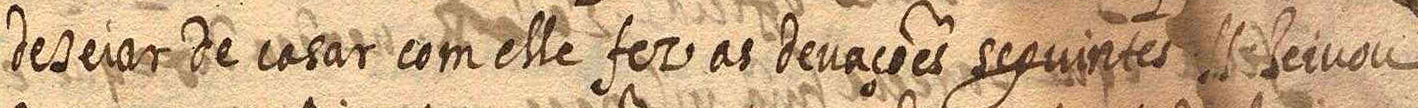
deseiar de casar com elle fez as deuações seguintes ss Ieiuou
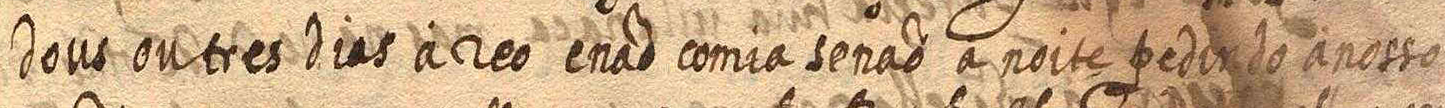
dous ou tres dias a reo e não comia senão a noite pedindo a nosso
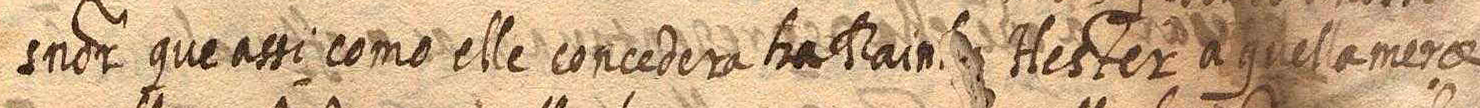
snōr que assi como elle concedera ha Rain_ Hester aquella merce
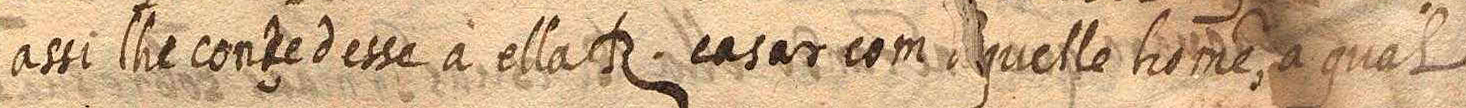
assi lhe concedesse a ella R. casar com _quelle homē, a quaL
